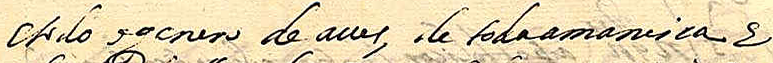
E todo o genero de aues, de toda a maneira E
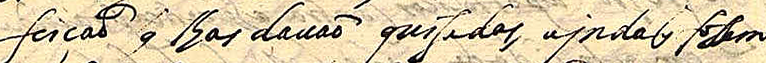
feiçaõ q̄ lhas dauaõ guisadas, ajnda q̄ fossem
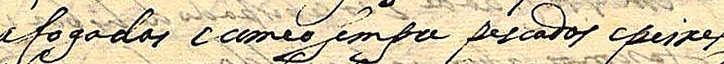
afogadas E comeo sempre pescados E peixes
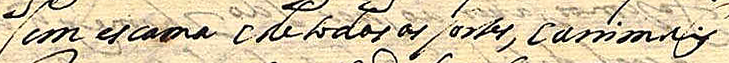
sem escama E de todas as sortes, E animais
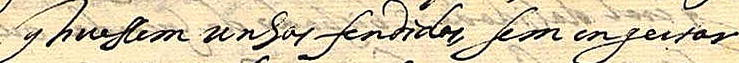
q̄ tiuessem unhas fendidas, sem engeitar
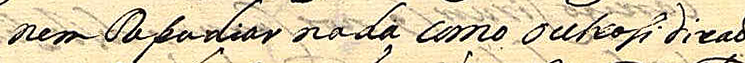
nem Repudiar nada como outrosi diraõ
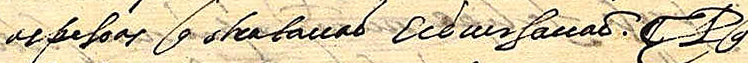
as pesoas q̄ o tratauaõ E cōuersauaõ. ¶ Ꝓ q̄
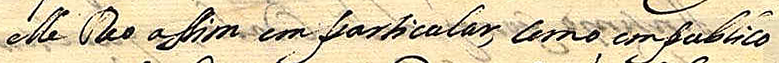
elle Reo assim em particular, como em publico
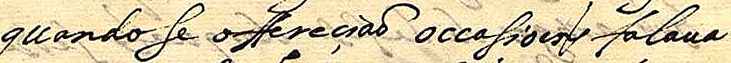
quando se offereçiaõ occasioens falaua
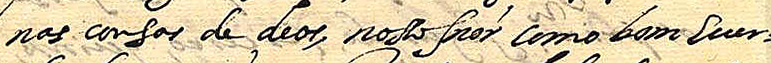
nas cousas de deos, nosso snor̄ como bom E uer
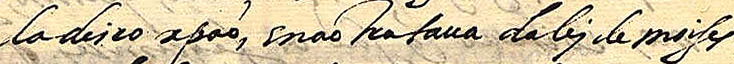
dadeiro xpaõ, E naõ trataua da lej de moises
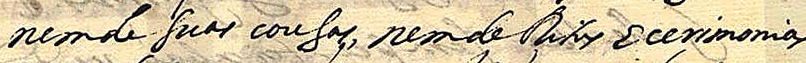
nem de suas cousas, nem de Ritos E cerimonias
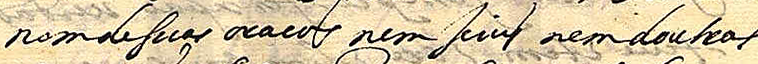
nem de suas oracōs nem Jeiūs nem doutras
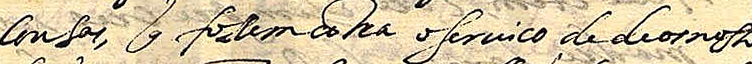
cousas, q̄ fossem cōtra o seruico de deos nosso
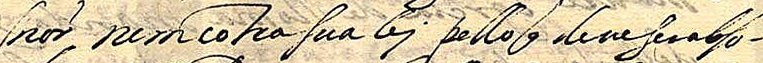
Snor̄ nem cōtra sua lej pello q̄ deue ser abso
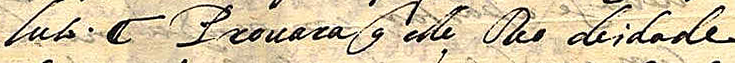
luto. ¶ Prouara q̄ elle Reo de idade
